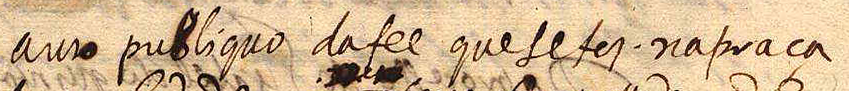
auto publiquo da fee que se fez na praça
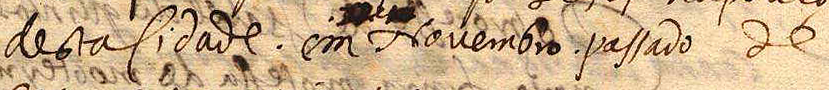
desta Cidade. em Nouembro passado de
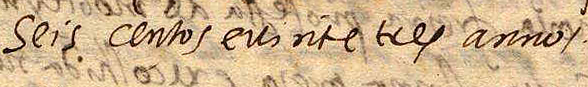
seiscentos e uinte tres annos
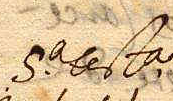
5.a testa.
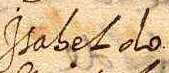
Jsabel do
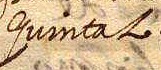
quintaL.
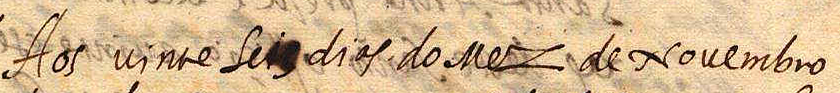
Aos uinte seis dias do MeZ de Nouembro
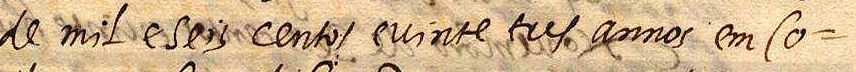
de miL e seiscentos e uinte tres annos em Co
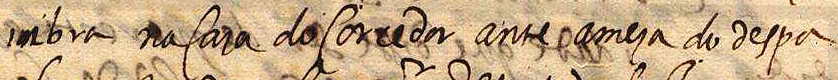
imbra na Caza do Corredor ante a meza do despa
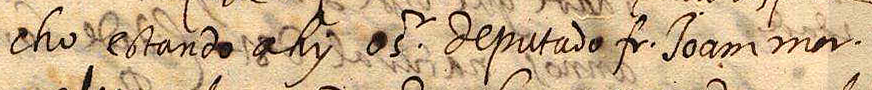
cho estando ahy o s.or deputado fr. Ioam mar
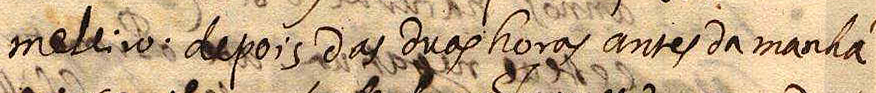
meleiro. depois das duas horas antes da manhā
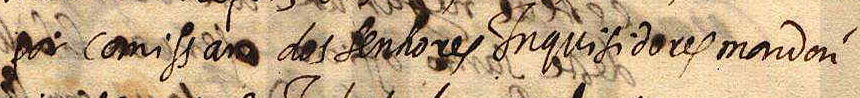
por comissam dos Senhores Inquisidores mandou
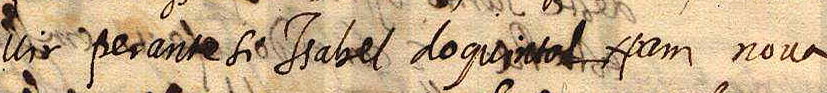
uir perante si Jsabel do quintal xpam noua
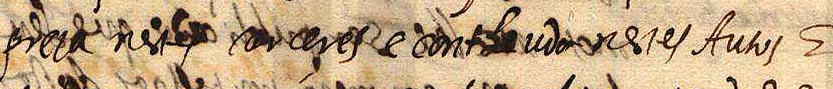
preza nestes carceres e contheuda nestes Autos E
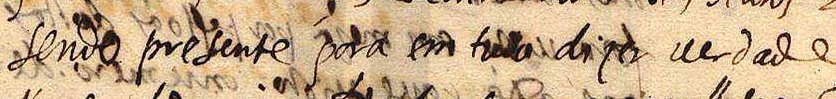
sendo presente para em tudo dizer uerdade
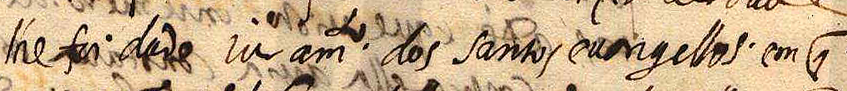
lhe foi dado iuramto. dos santos euangelhos. em q̄.
